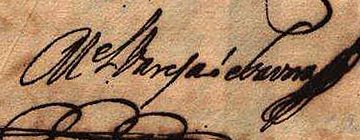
Mel. Varejaõ e Tavora
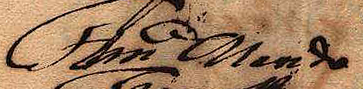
Franco Mendo
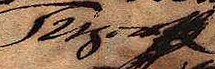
Trigozo
